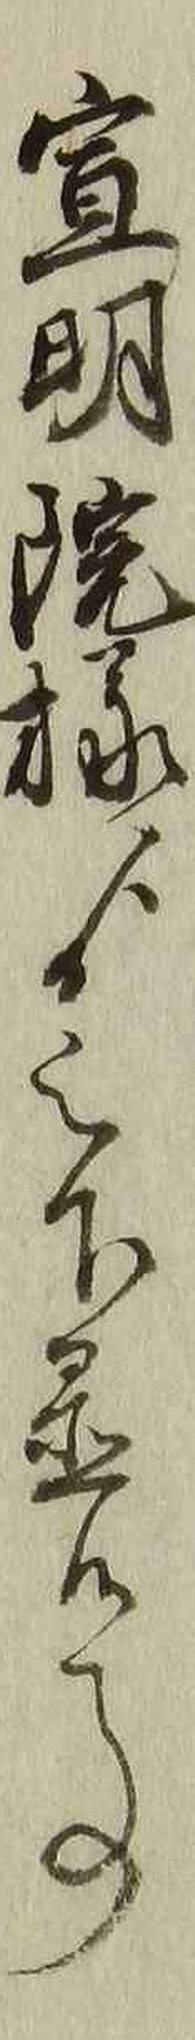宣明院様ゟ被下置候事
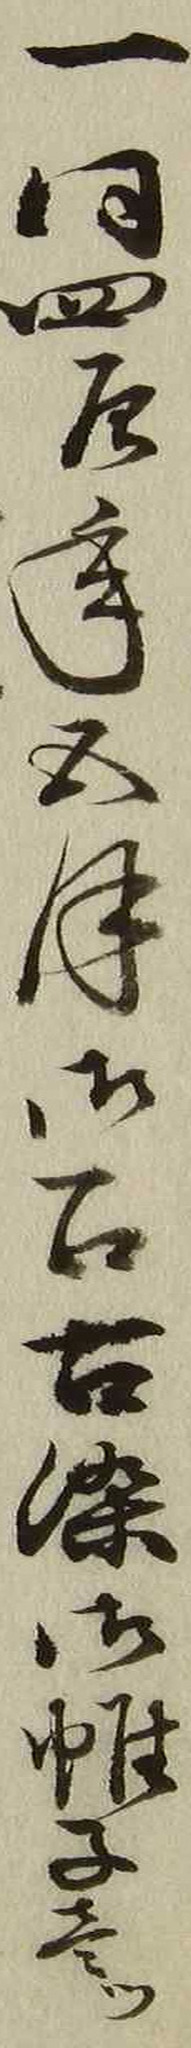一同四辰年五月御召古染御帷子壱ツ
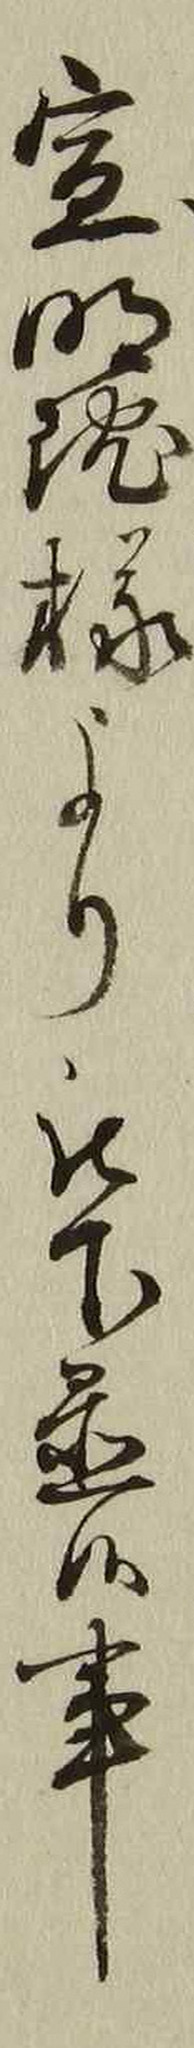宣明院様より被下置候事
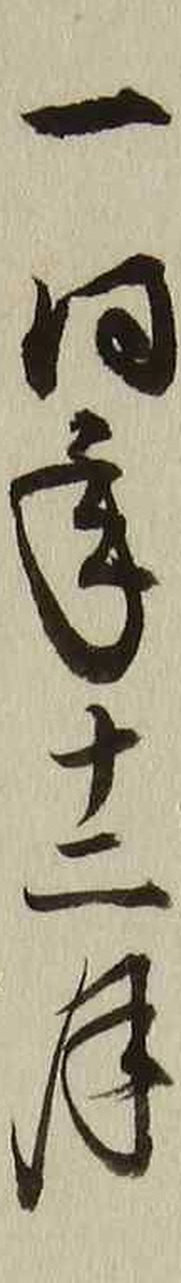一同年十二月
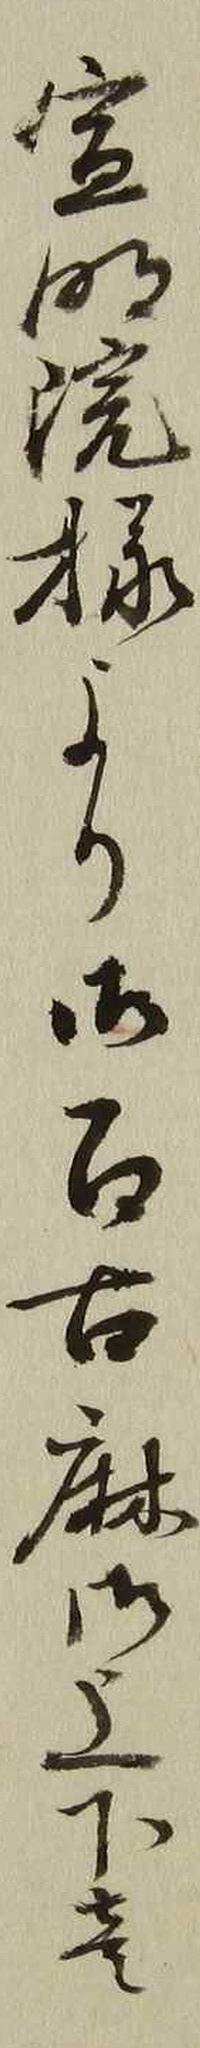宣明院様より御召古麻御上下壱
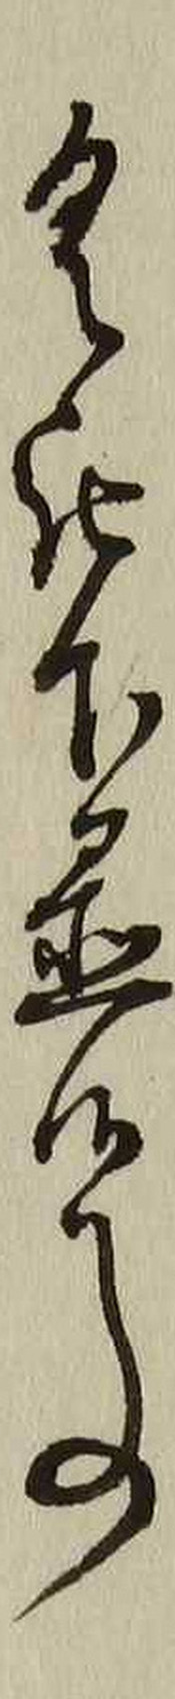具被下置候事
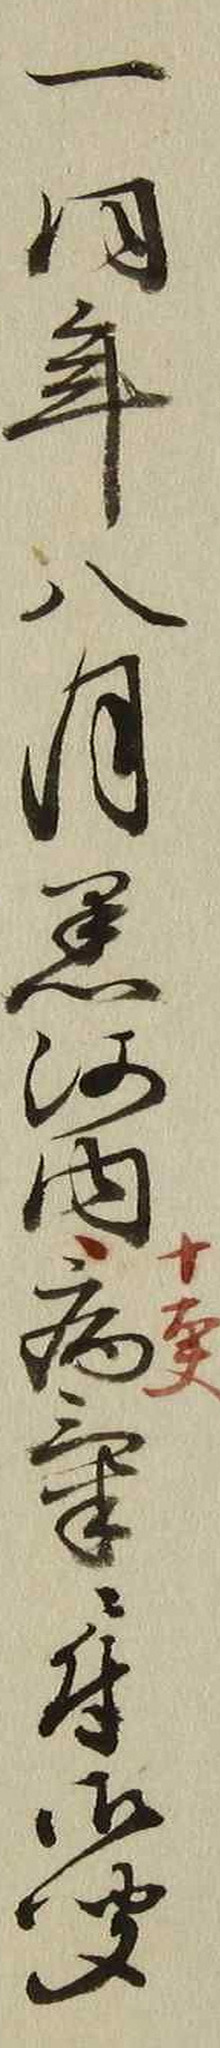一同年八月黒河内病気付ニ御聞
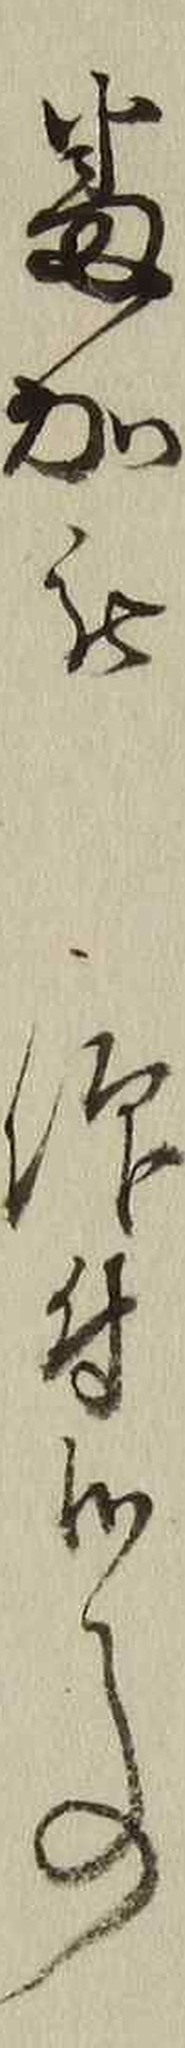番加被仰付候事
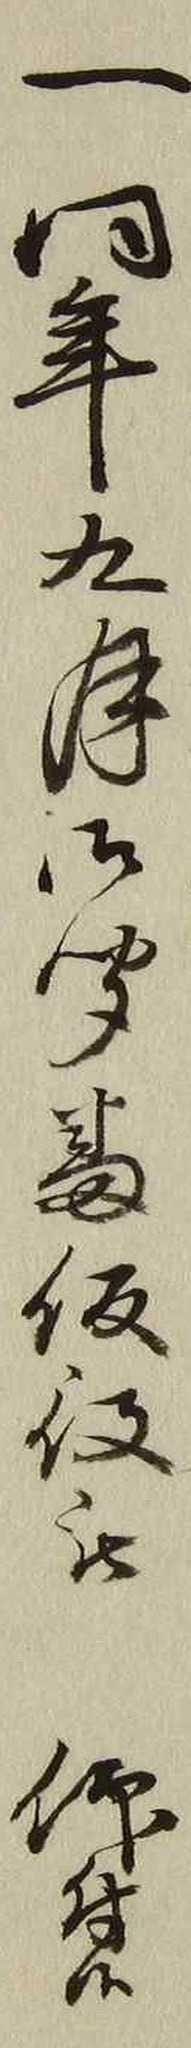一同年九月御聞番仮役被仰付候
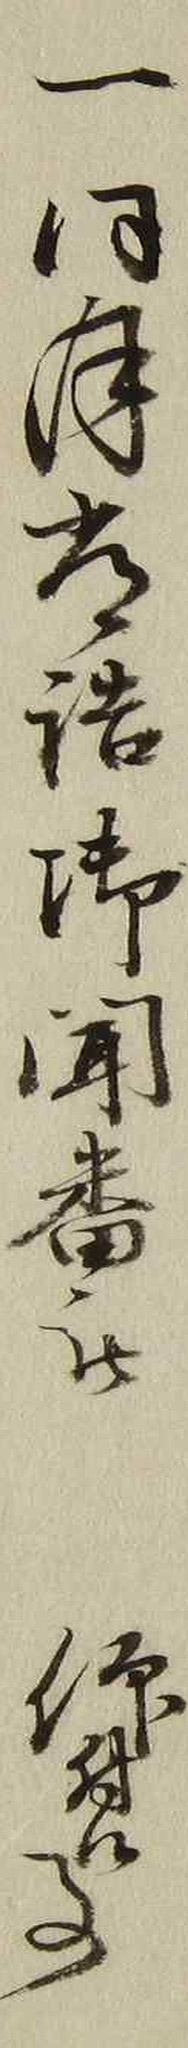一同月常詰御聞番被仰付候事
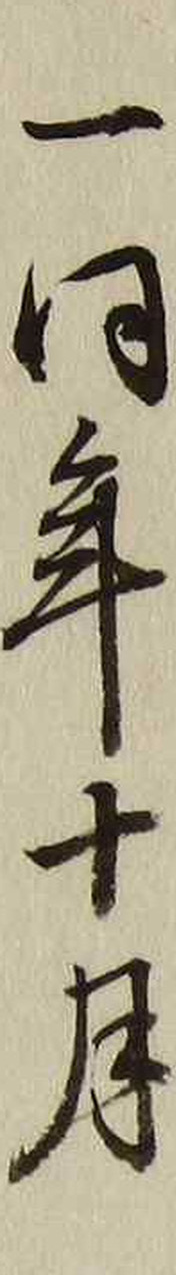一同年十月
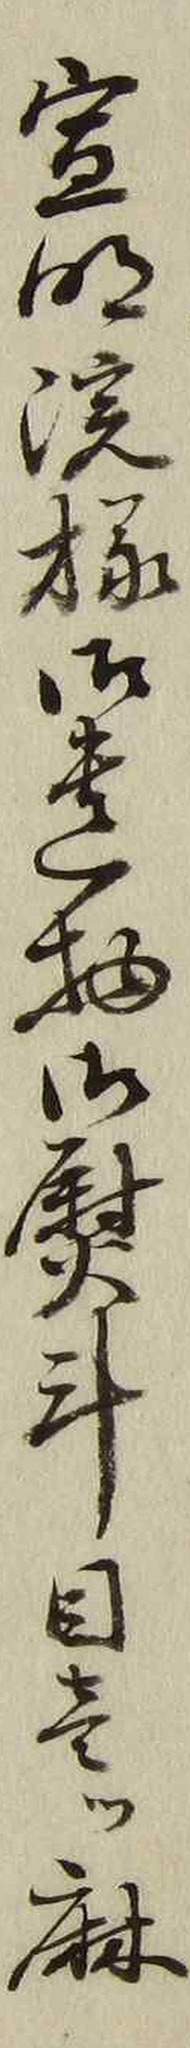宣明院様御遺物御熨斗目壱ツ麻
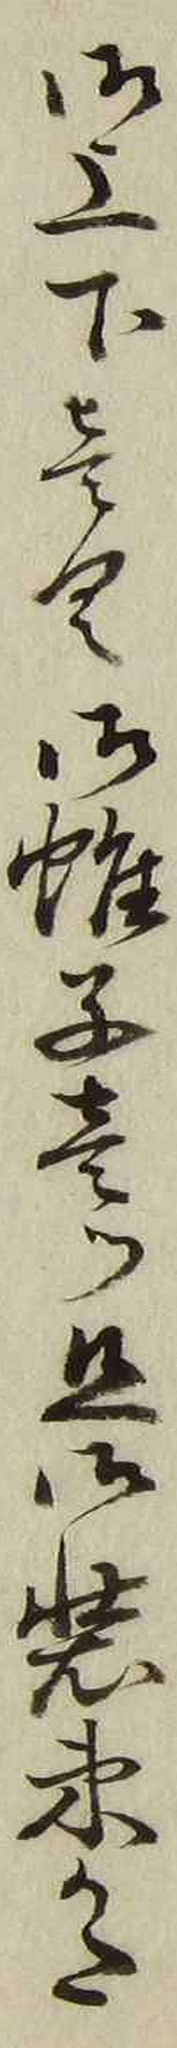御上下壱具御帷子壱ツ且御装束かた
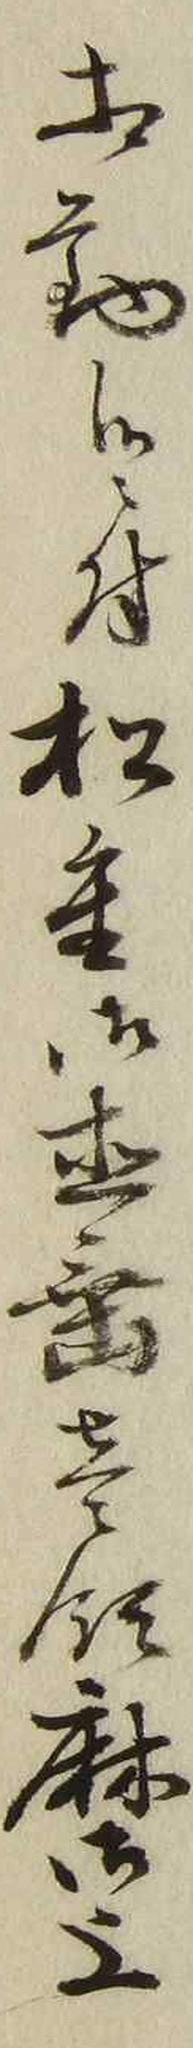相勤候ニ付松重御直垂壱領麻御上

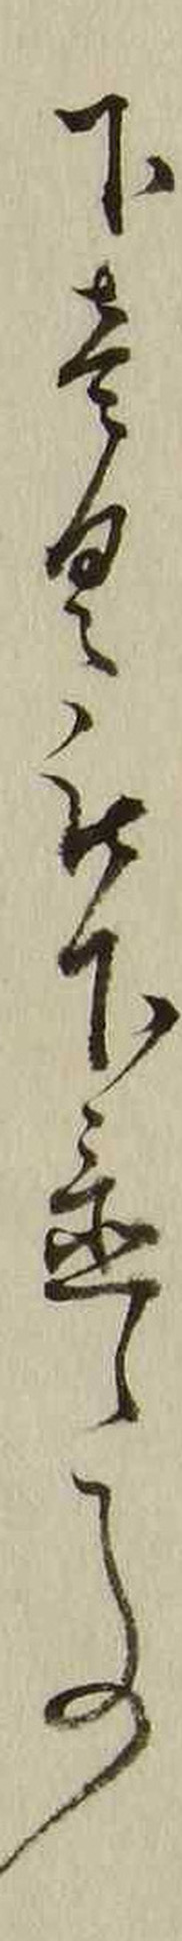下壱具被下置候事
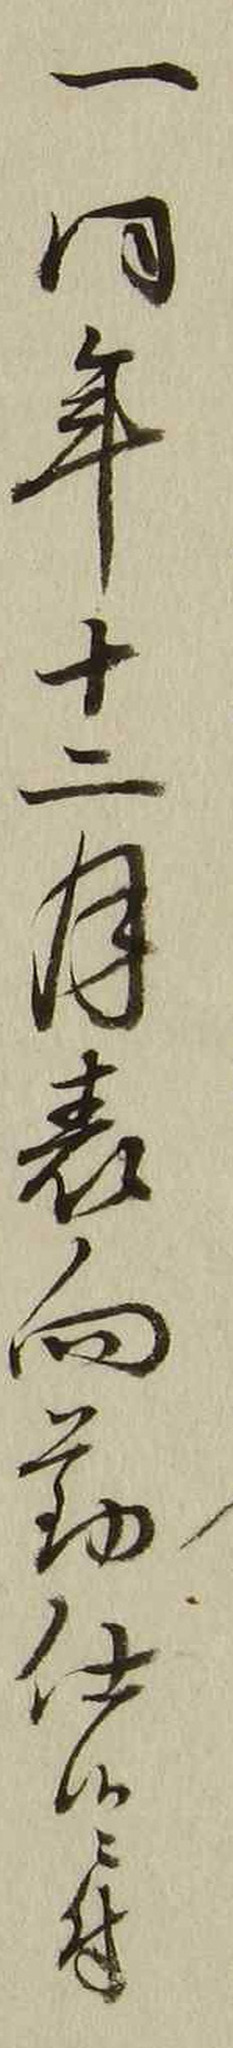一同年十二月表向勤仕候ニ付
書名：諸士系譜　巻之35　は之部3
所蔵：会津若松市立会津図書館
